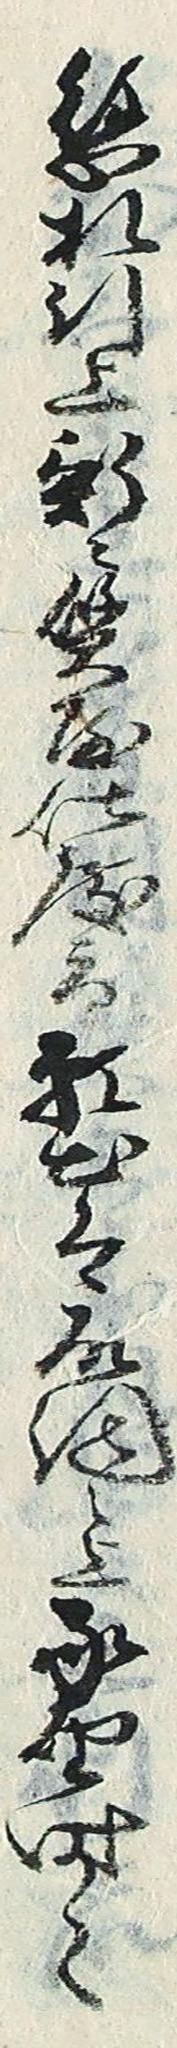懸札引上新ニ質屋仕度旨願出候ハヽ取調之上承届時々
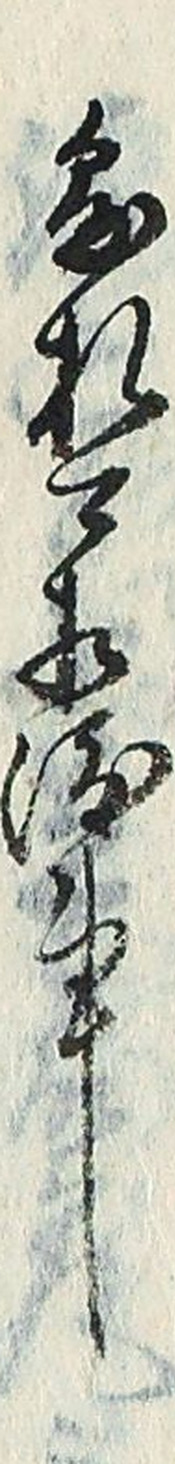懸札可相渡事
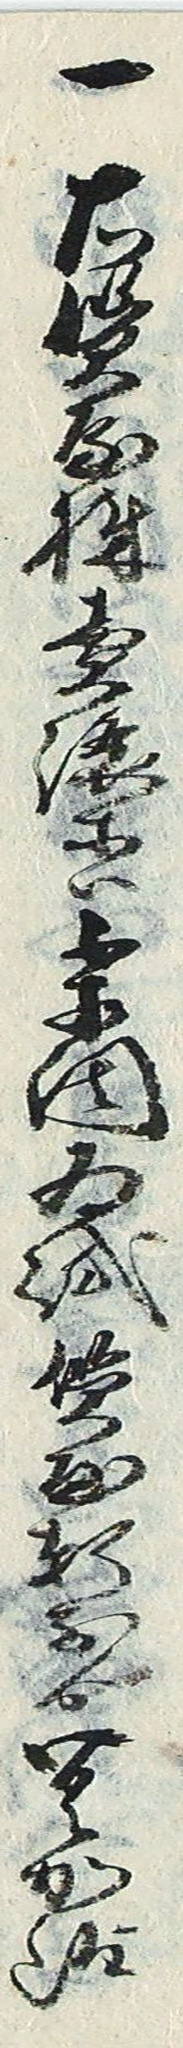一右質屋株賣譲等ハ不相調為試質屋軒別ゟ冥加銀
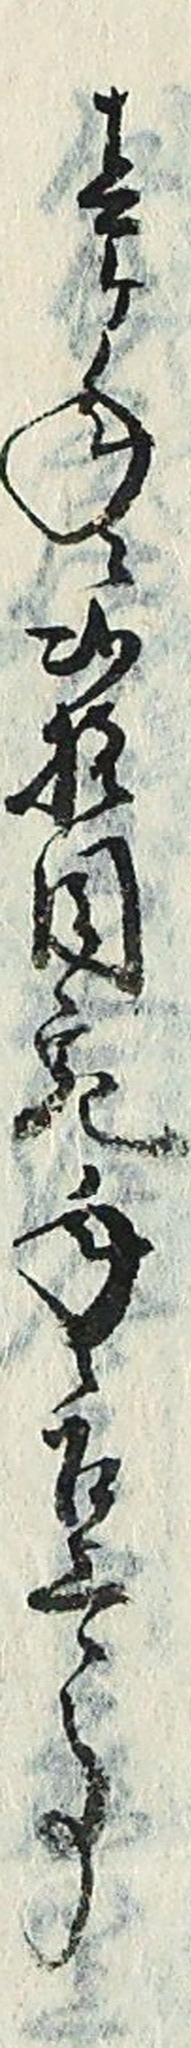壱ケ年ニ弐拾目宛年々召上候事
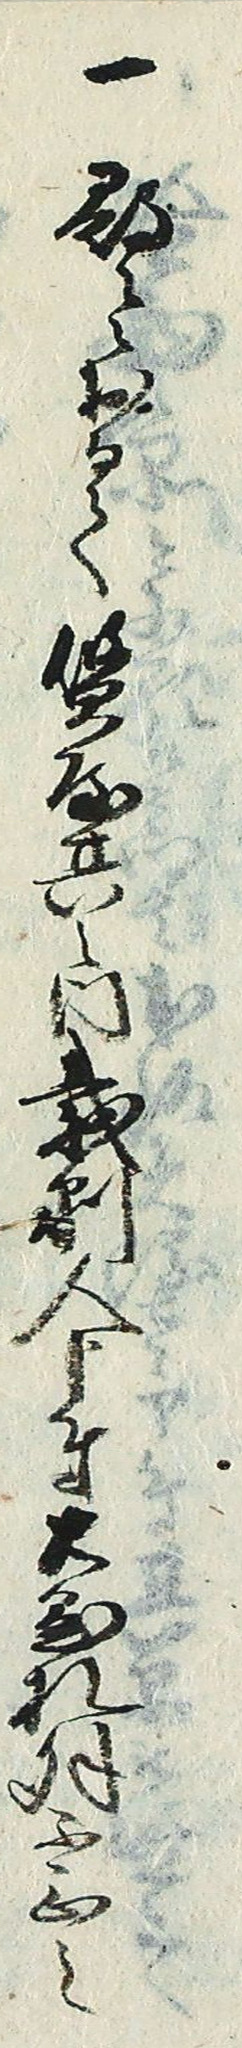一郡々ニおゐて質屋共之内裁判人申付右懸札外不正之
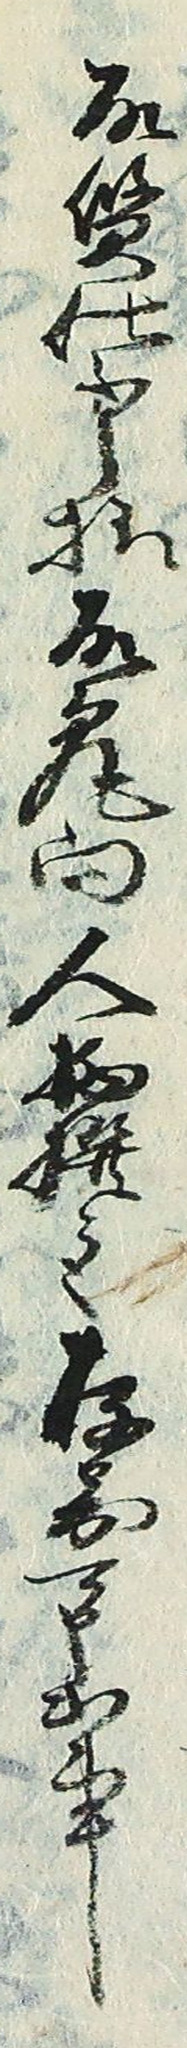取質仕不申様取究向人柄撰とも存寄可申出事
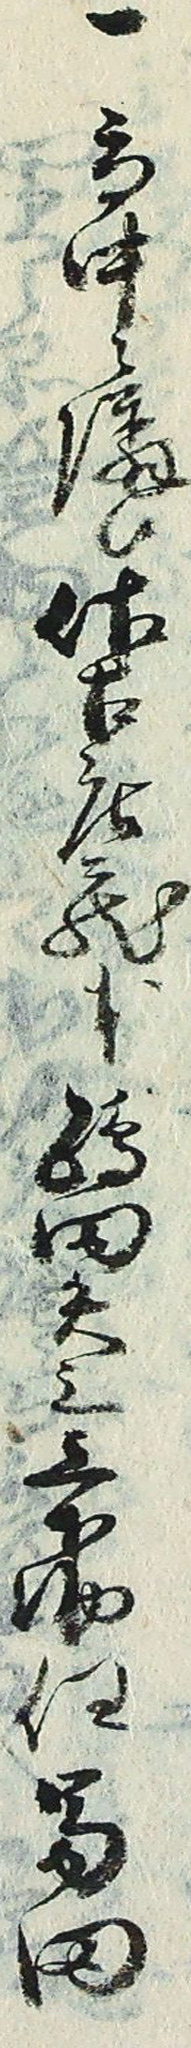一市中ニ構候佐古庄蔵本嶋田矢三上下助任富田
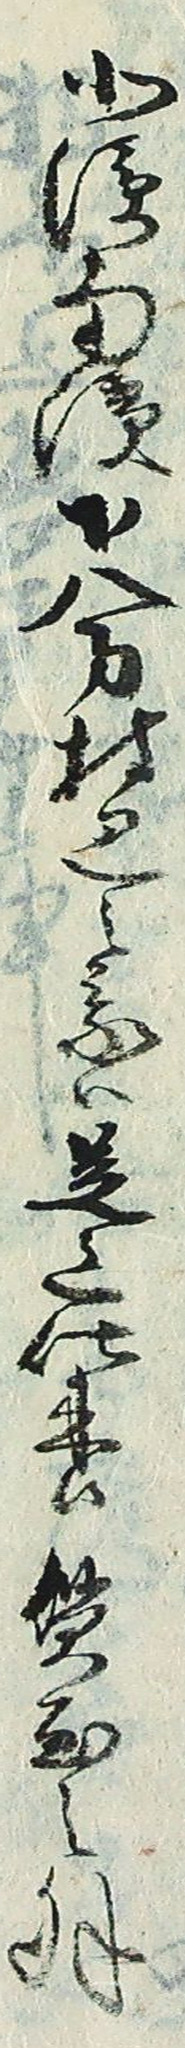北濱南濱下八万村廻之義ハ是迄仕来候質屋之外
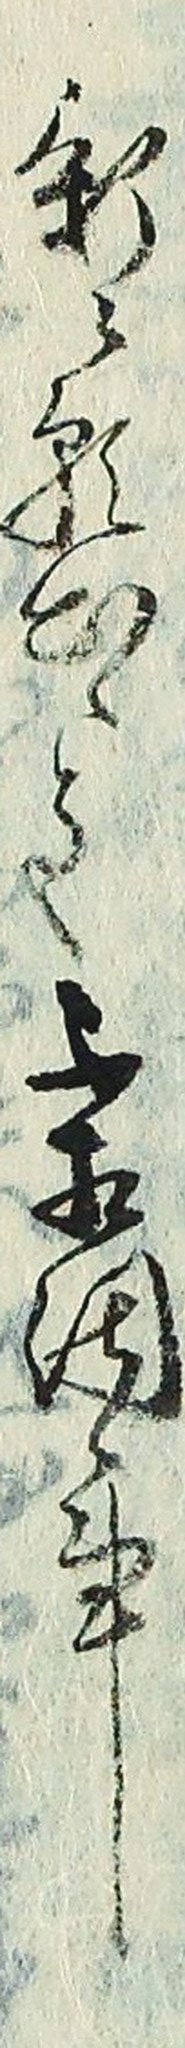新ニ願出候之不相調候事
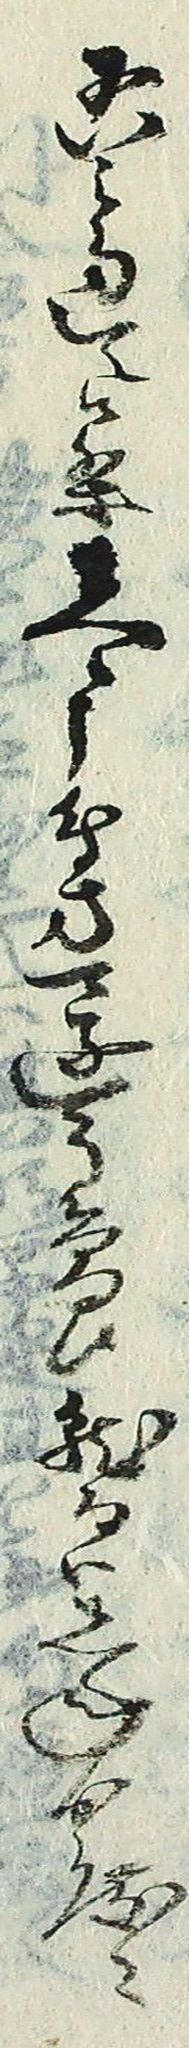右之通ニ候条夫々申付方可遂了簡候就而ハ先年ゟ度々
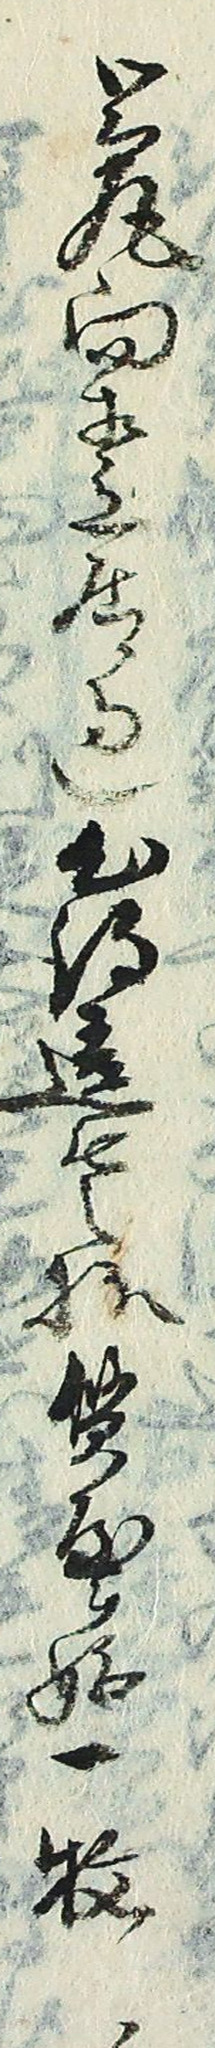御究向相立居候通心得違無之様質屋ヲ始一枚ニ
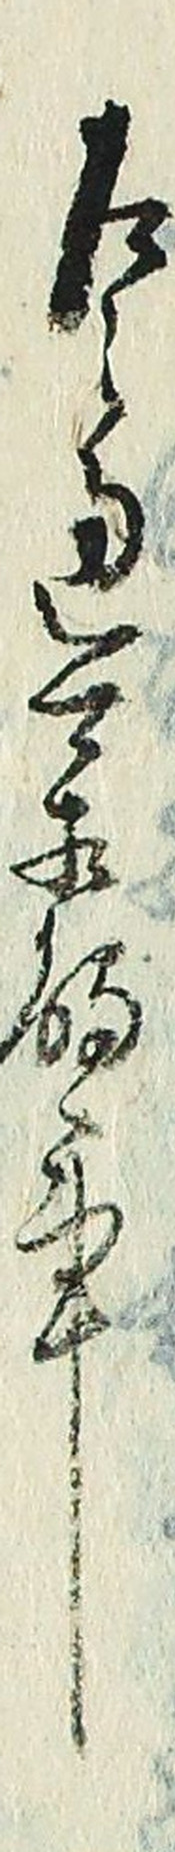右之通可相觸候事
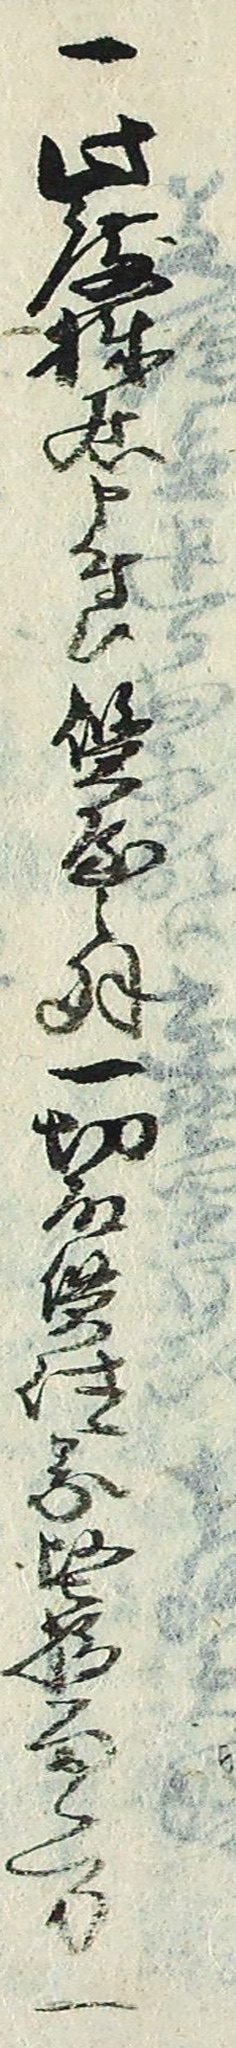一此度株居申付候質屋之外一切取質仕候義堅指留候万一
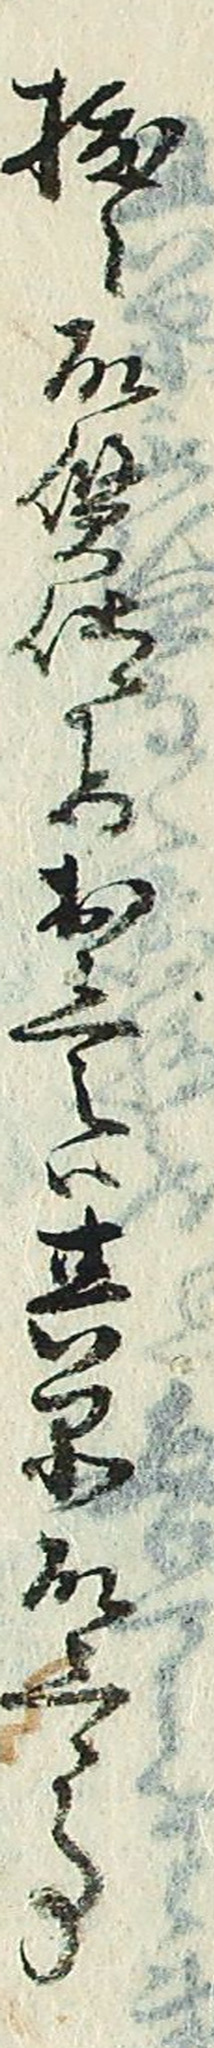抜之取質仕候者於有之ハ其品取上候事
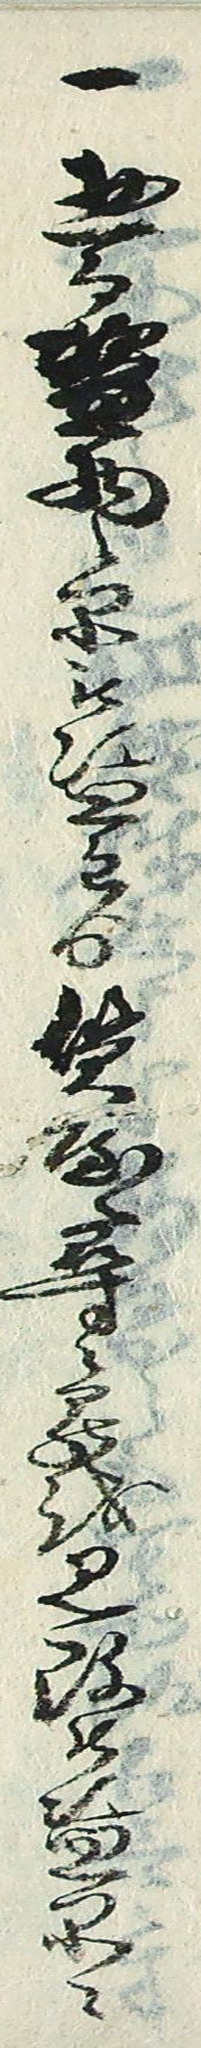一惣而盗物之品被盗主ゟ質屋へ尋ニ罷越見改被盗品々
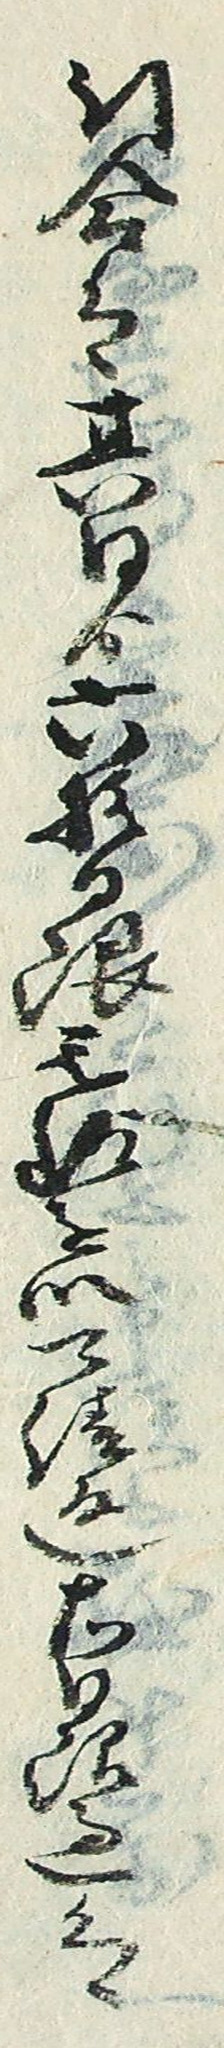引合候ハヽ其日ゟ六拾日限元銀を以可請返右日限過候ハヽ
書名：市郷質屋株御取究並御書出御趣法之写
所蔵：鳴門教育大学 Naruto University of Education
